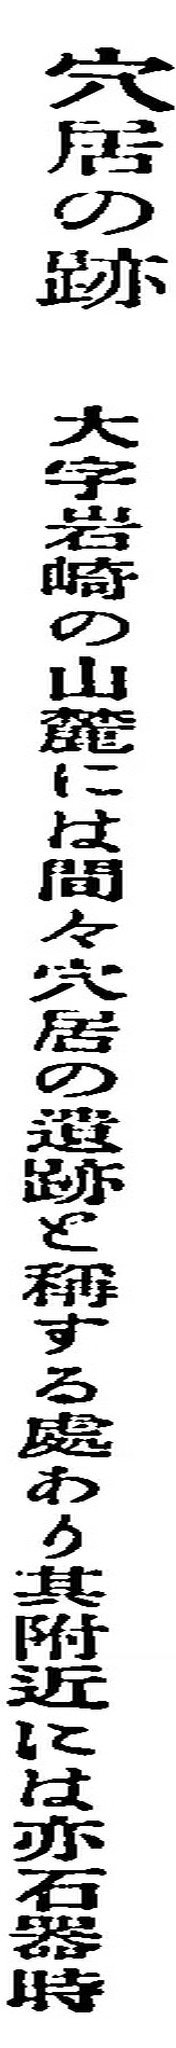穴居の跡大字岩崎の山麓には間々穴居の遺跡と稱する處あり其附近には亦石器時
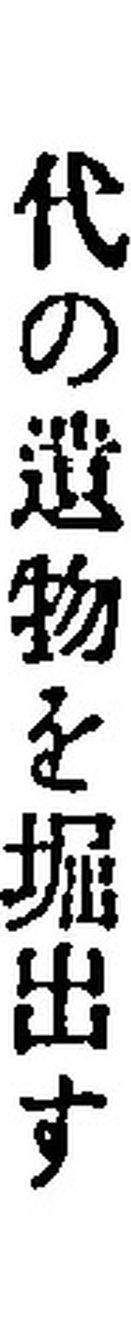代の遺物を掘出す
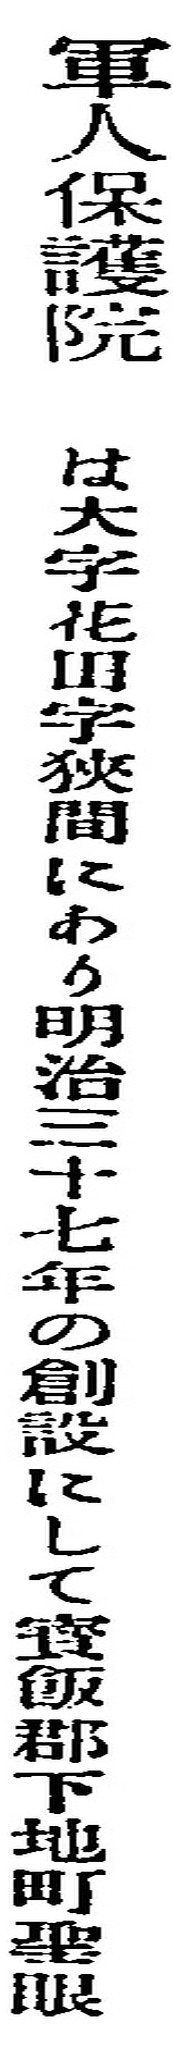軍人保護院は大字花田字狭間にあり明治三十七年の創立にして寶飯郡下地町聖眼
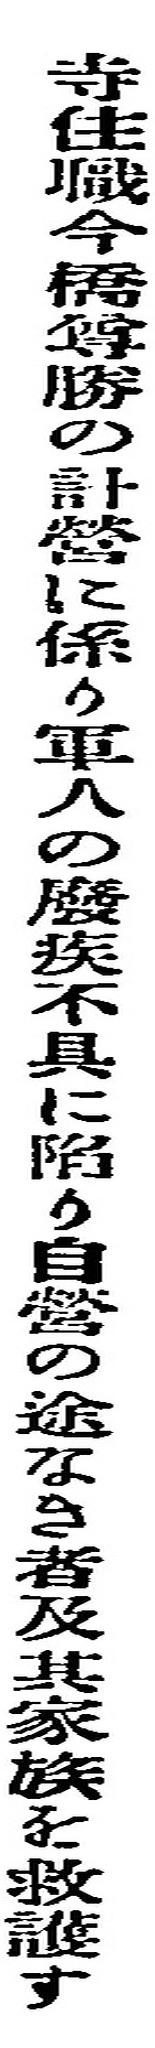寺住職今橋尊勝の計營に係り軍人の廢疾不具に陷り自營の途なき者及其家族を救護す
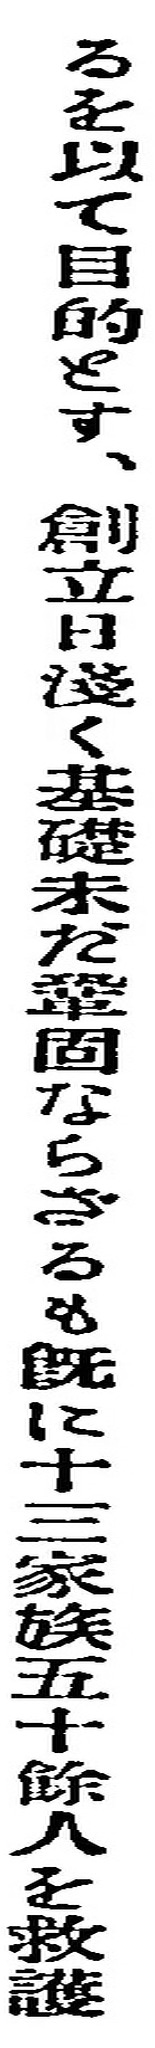るを以て目的とす、創立日淺く基礎未だ鞏固ならざるも旣に十三家族五十餘人を救護
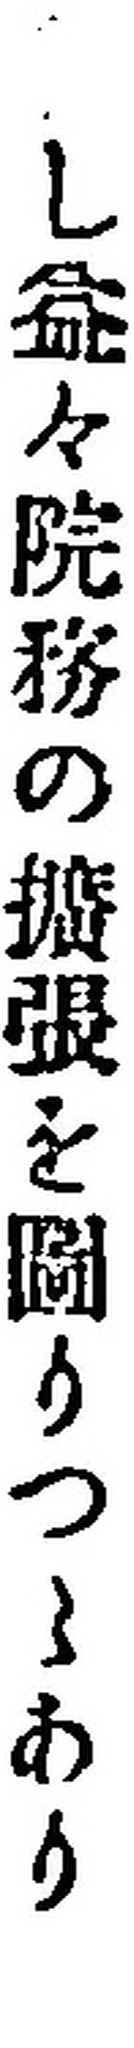し益々院務の擴張を圖りつゝあり

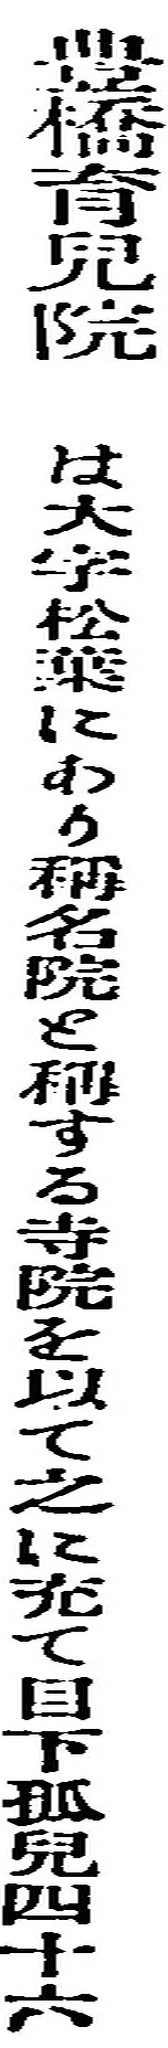豊橋育兒院は大字松葉にあり稱名院と稱する寺院を以て之に充て目下弧兒四十六
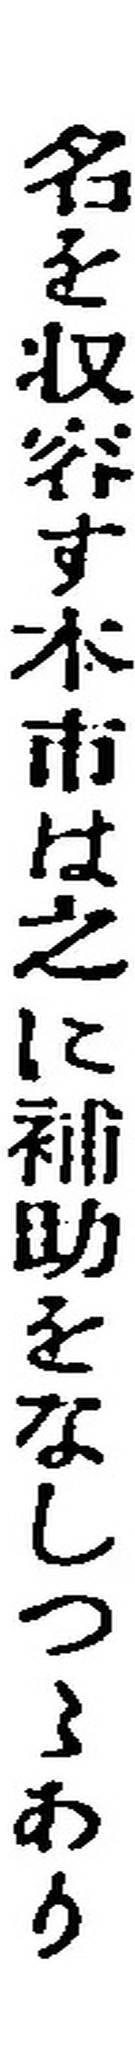名を収容す本市は之に補助をなしつゝあり
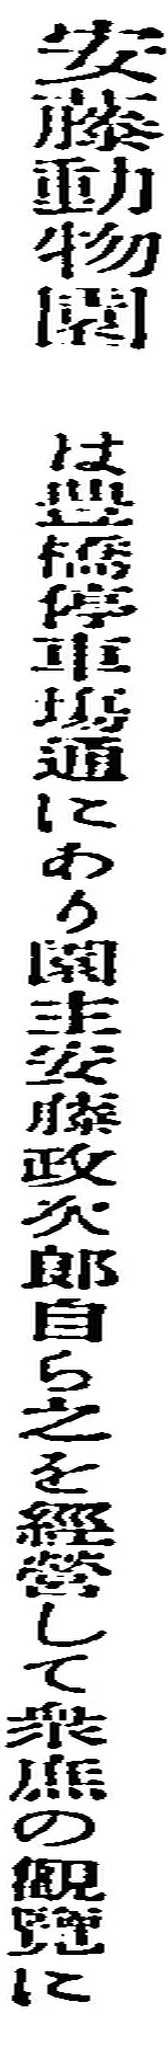安藤動物園は豊橋停車場通にあり圓主安藤政次郞自ら之を經營して衆庶の觀覧に
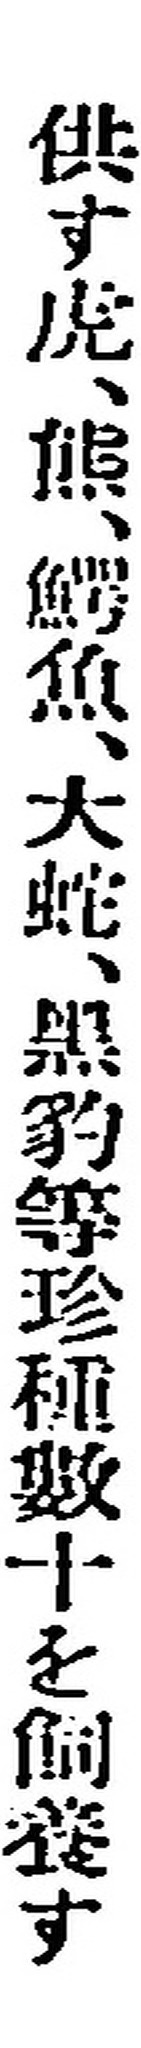供す虎、熊、鰐魚、大蛇、黑豹等珍種數十を飼養す
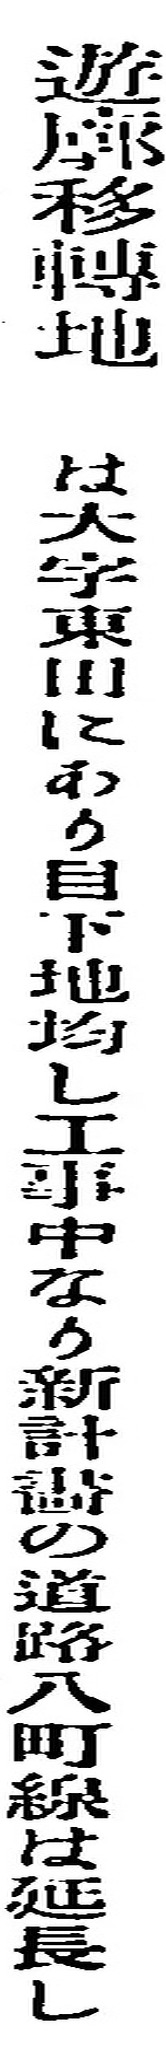遊廓移轉地は大字東山にあり目下地均し工事中なり新計畵の道路八町線は延長し
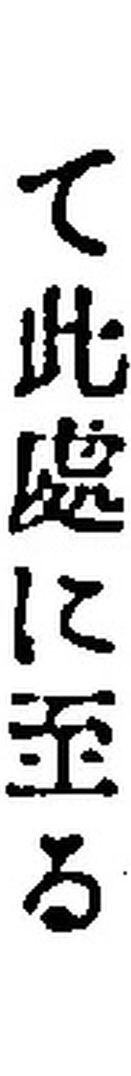て此處に至る
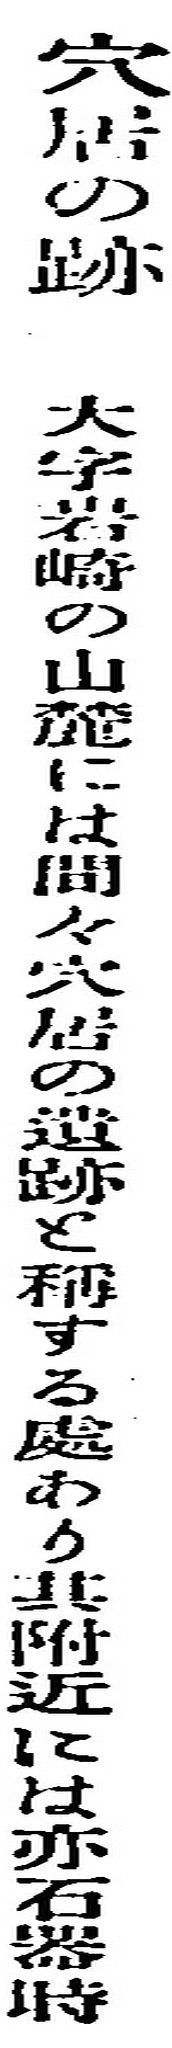穴居の跡大字岩崎の山麓には間々穴居の遺跡と稱する處あり其附近には亦石器時
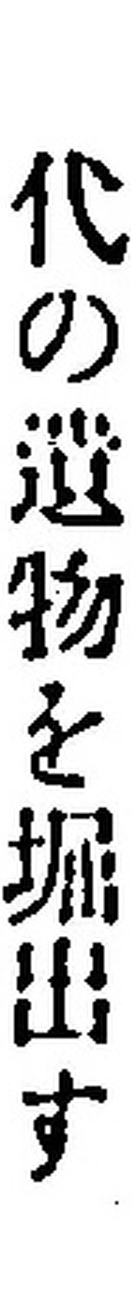代の遺物を掘出す
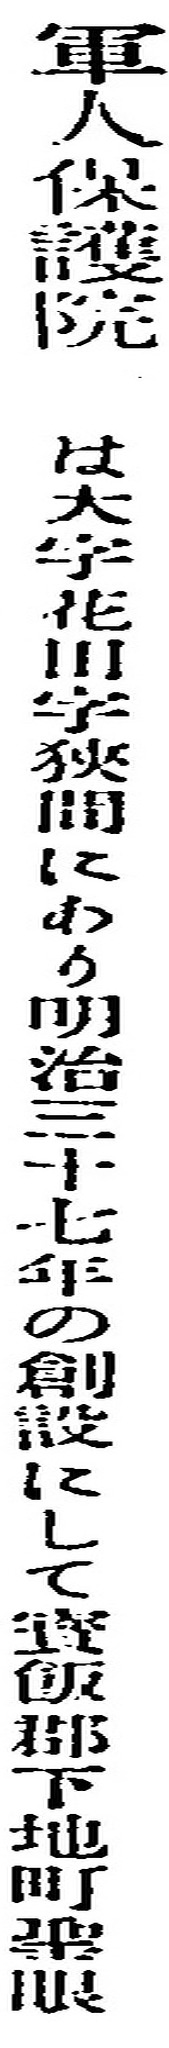軍人保護院は大字花田字狭間にあり明治三十七年の創立にして寶飯郡下地町聖眼
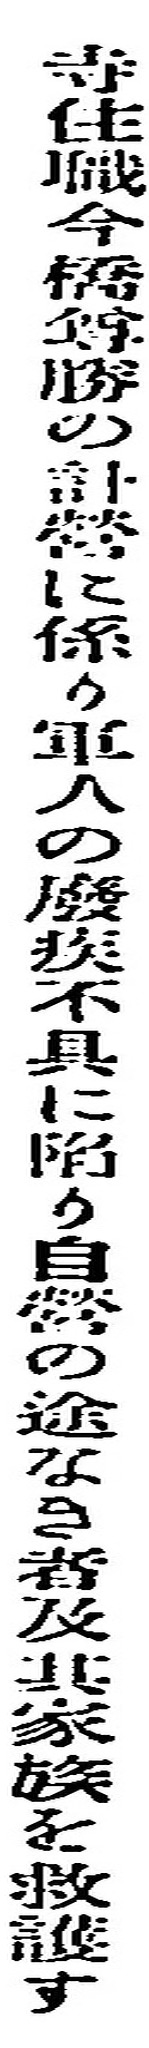寺住職今橋尊勝の計營に係り軍人の廢疾不具に陷り自營の途なき者及其家族を救護す
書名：豊橋志要
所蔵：国立国会図書館 National Diet Library, JAPAN
